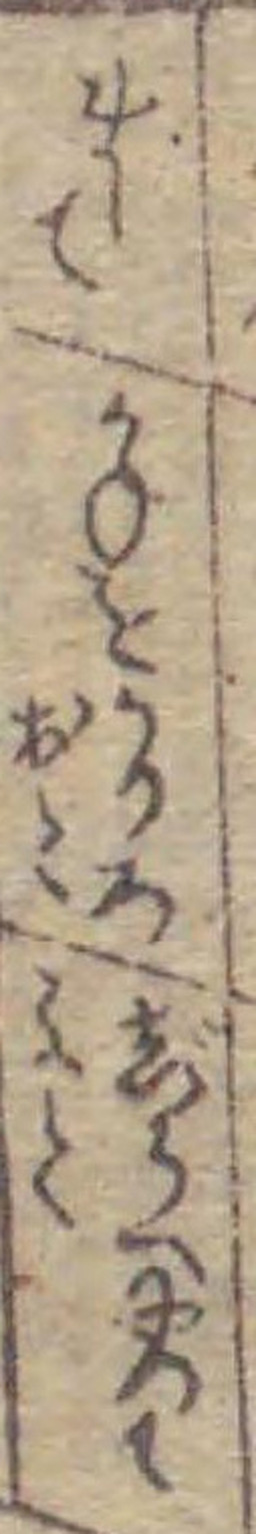ましてかねをかりろじうへやつて
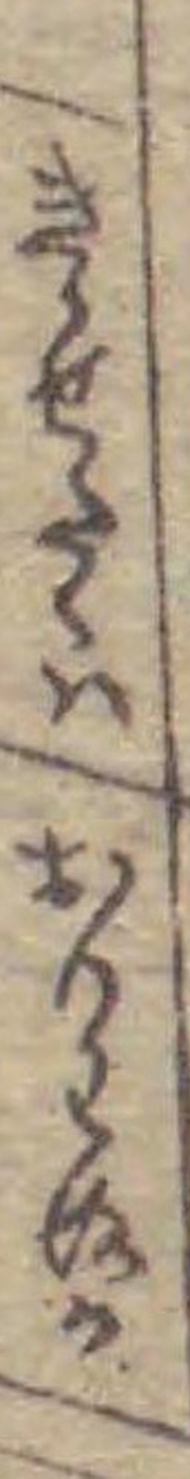きらせたくはおもわぬか

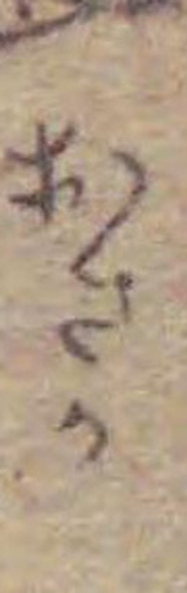おさか
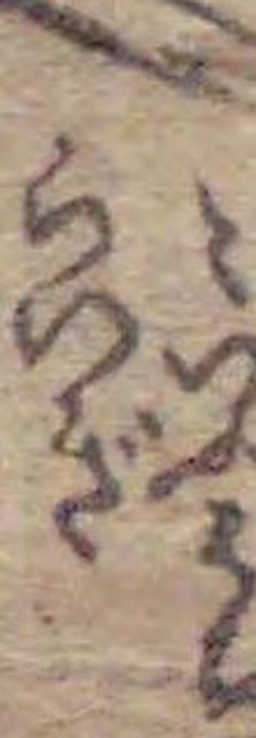らいぎ
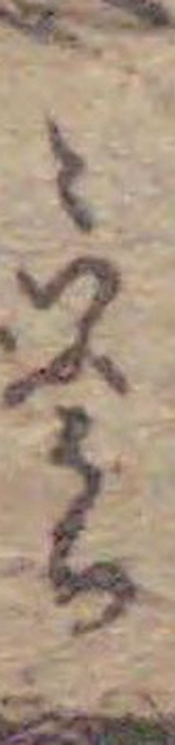といふうち
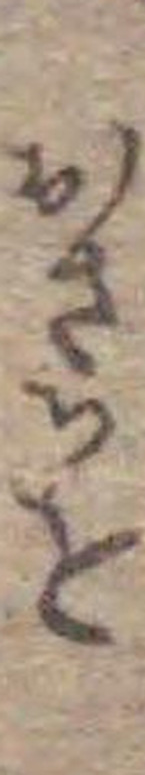おさかを
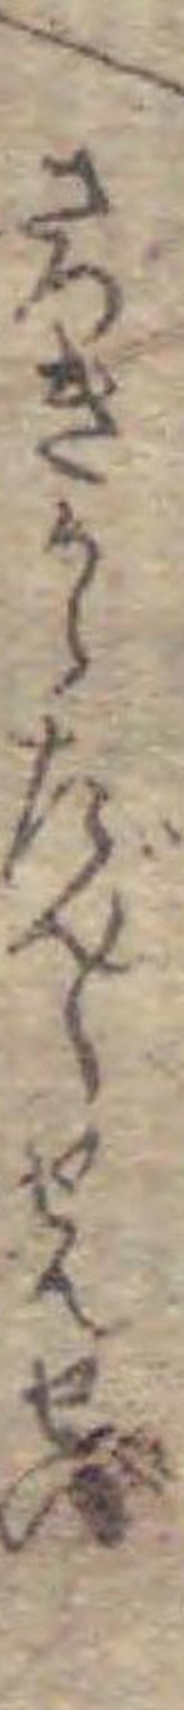さつきからだん〳〵せんせい
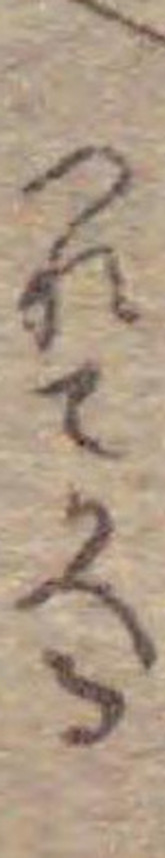つれてかへる
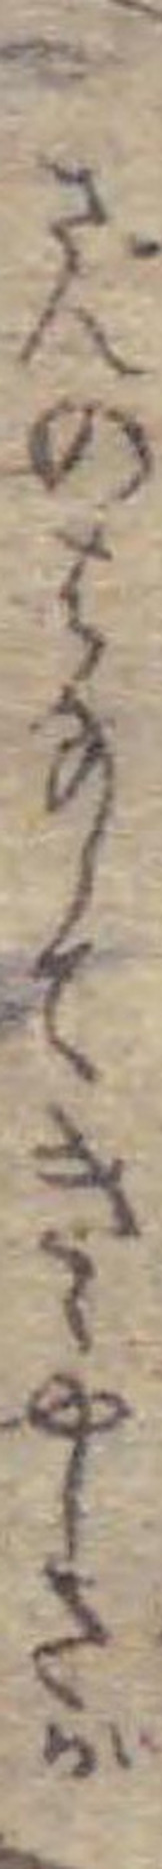さんのはなしてきゝやしたが
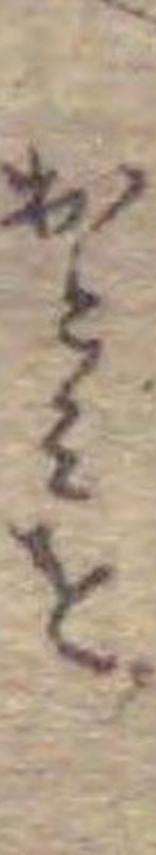おとみを
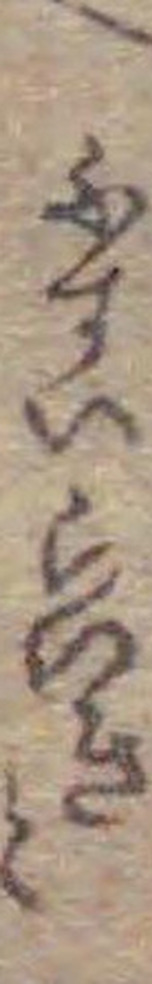ふすいらいきと
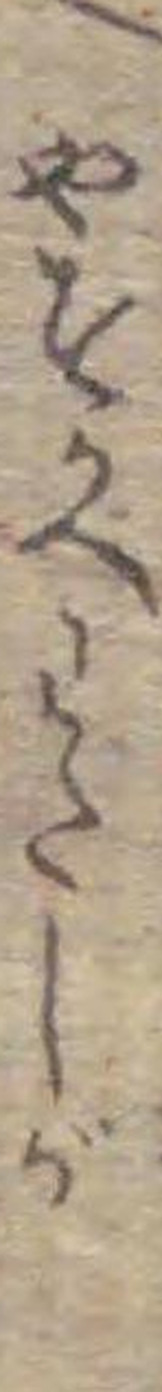やすかへわたしが
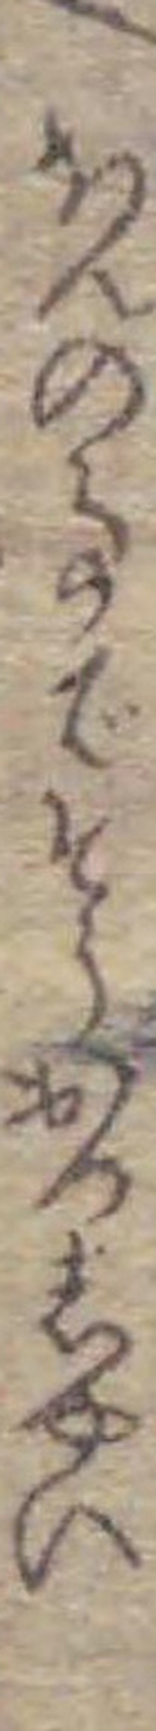ほんの事でそうおつしやい
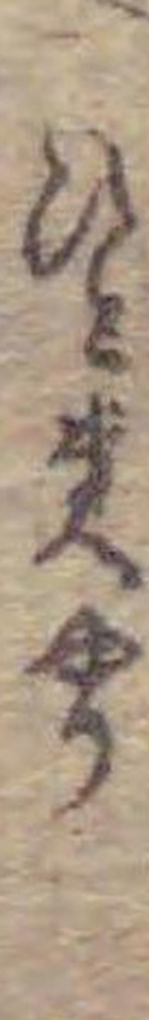ひとまへやり
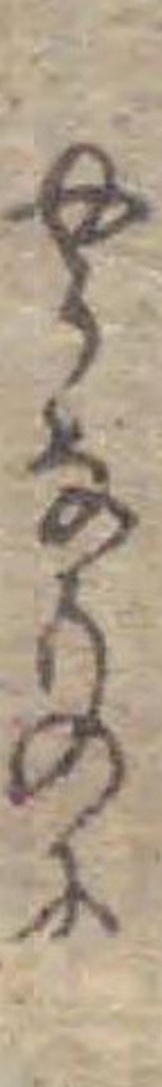やうなものに
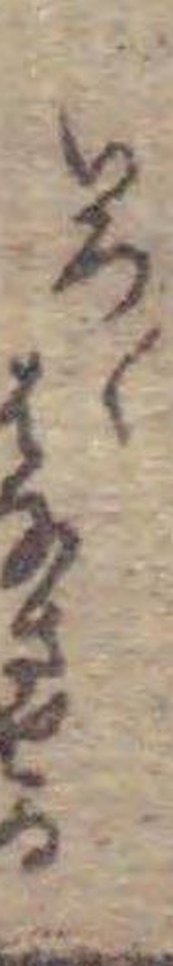いろ〳〵
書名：芸者呼子鳥 : 2巻（松泉堂）
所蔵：国立国会図書館 National Diet Library, JAPAN
